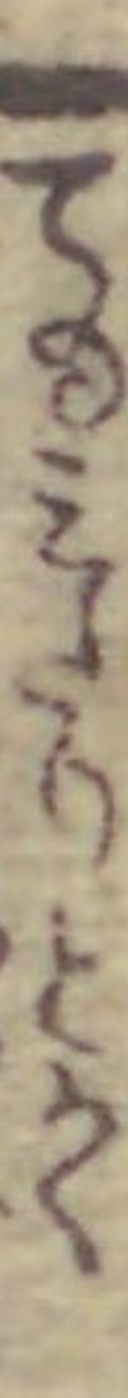てもみたりとかく
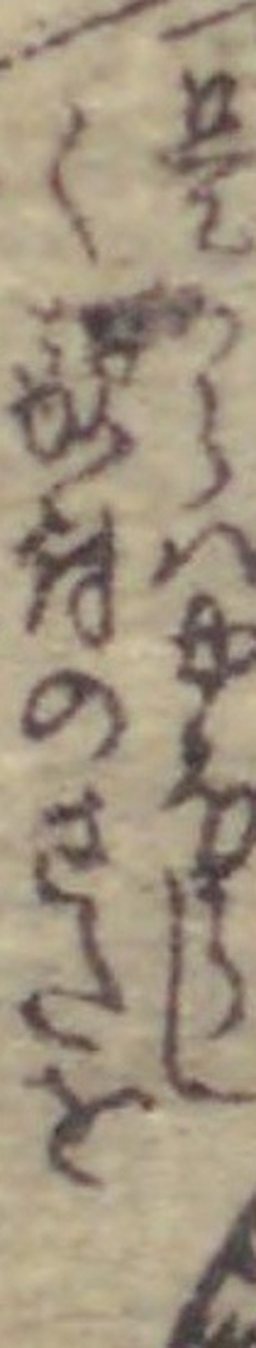く敵討のさたを
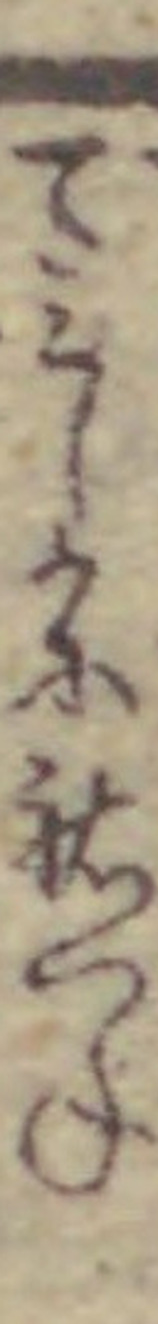てみしかに祐つね
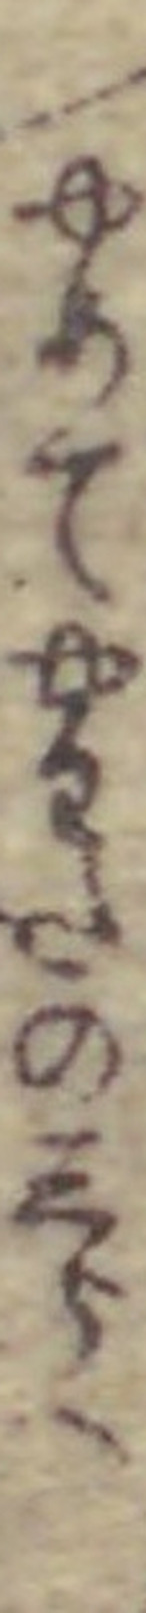やめてやわたの三郎へ
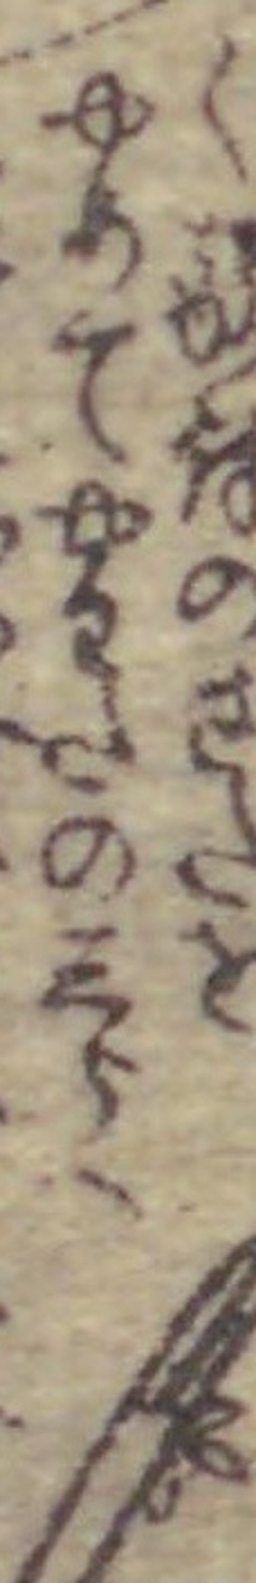やめてやわたの三郎へ
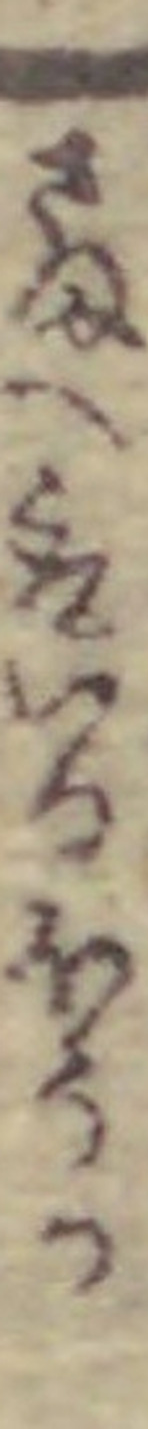さまへ取いるほうか
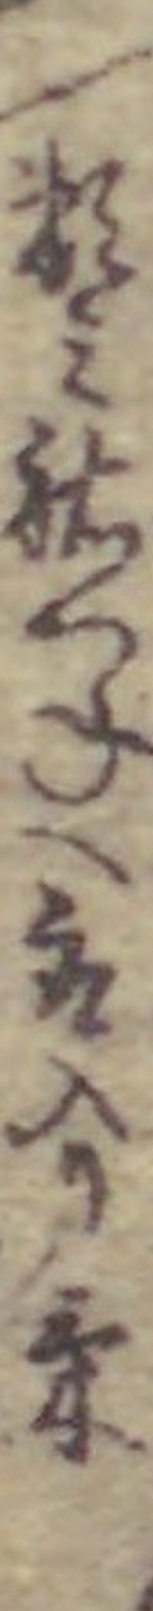頼み祐つねへ取入り気
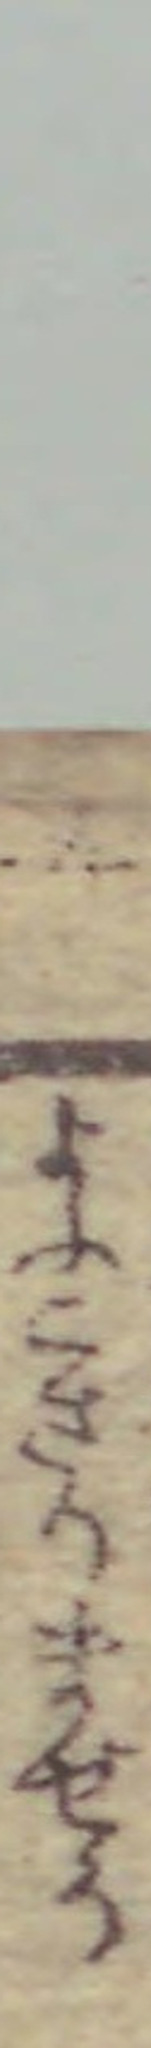よふこさりませう
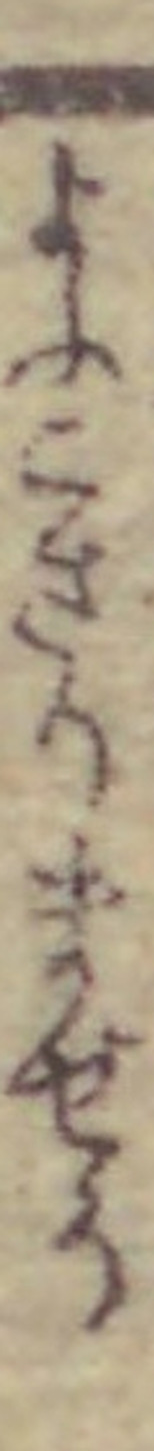よふこさりませう
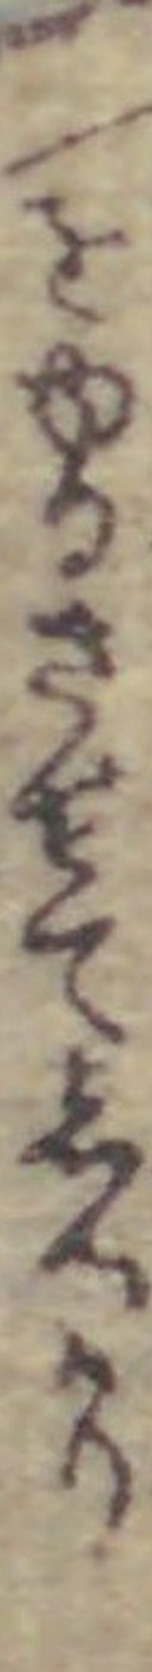をゆるさせてしつかり
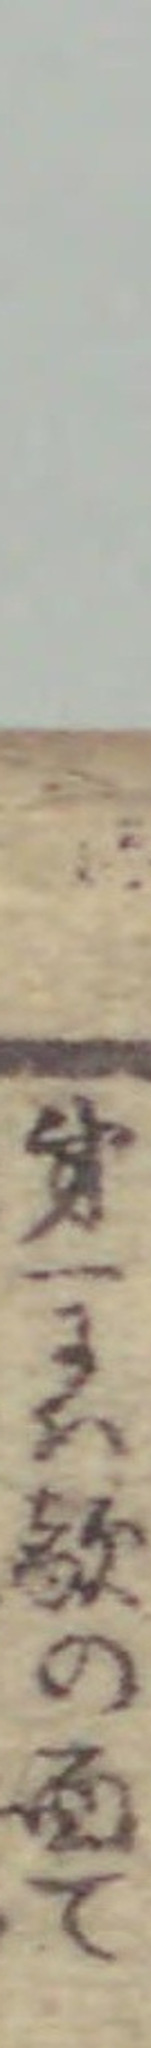第一には敵の面て
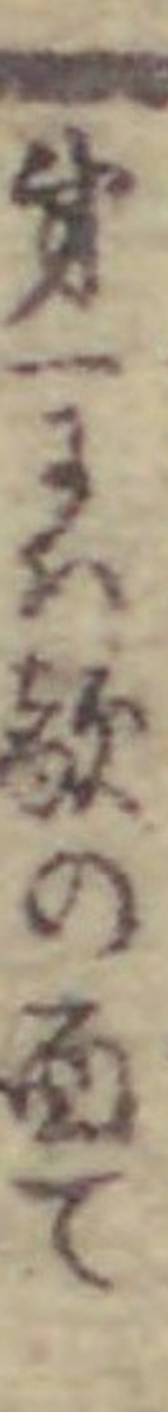第一には敵の面て
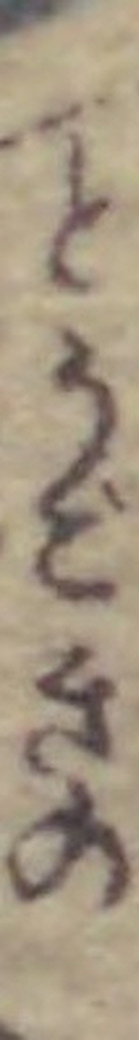とうごきの
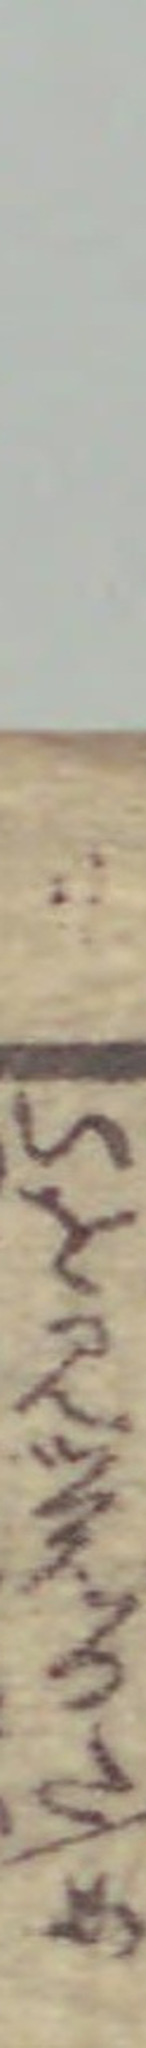いを見覚るため
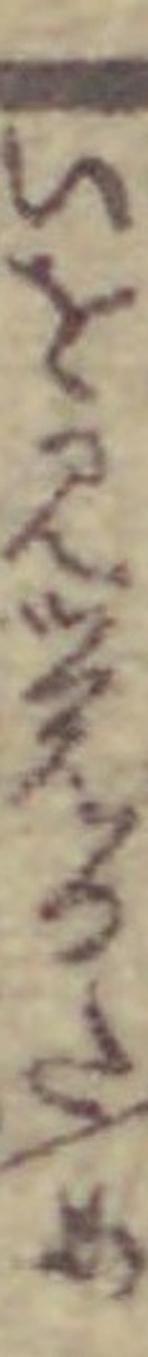いを見覚るため
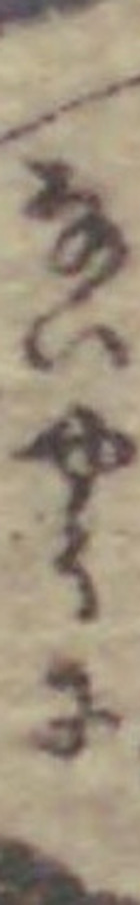ないやうに
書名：間似合嘘言曽我 3巻
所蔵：国立国会図書館 National Diet Library, JAPAN
